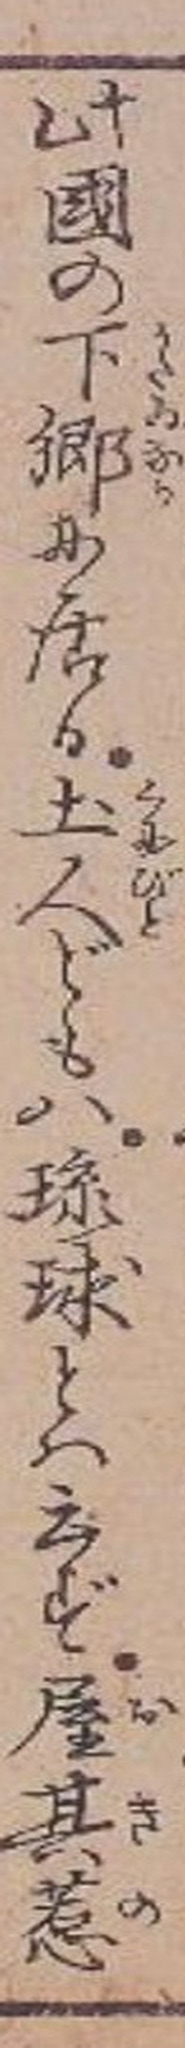此国の下郷に居る•土人どもは•琉球とは云ず•屋其惹
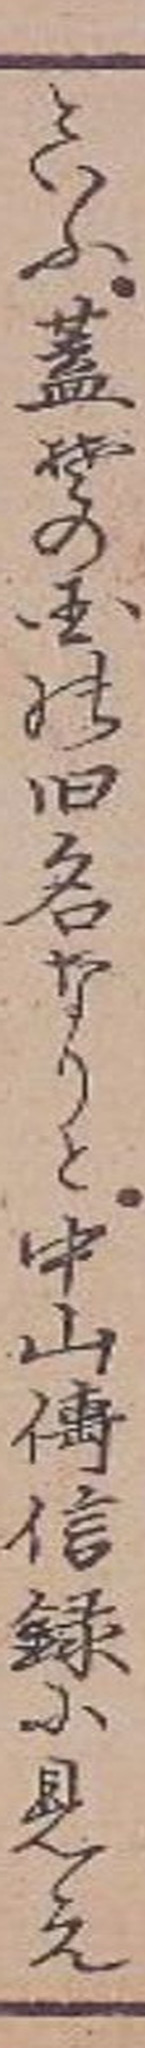といふ•蓋その国の旧名なりと•中山伝信録に見え
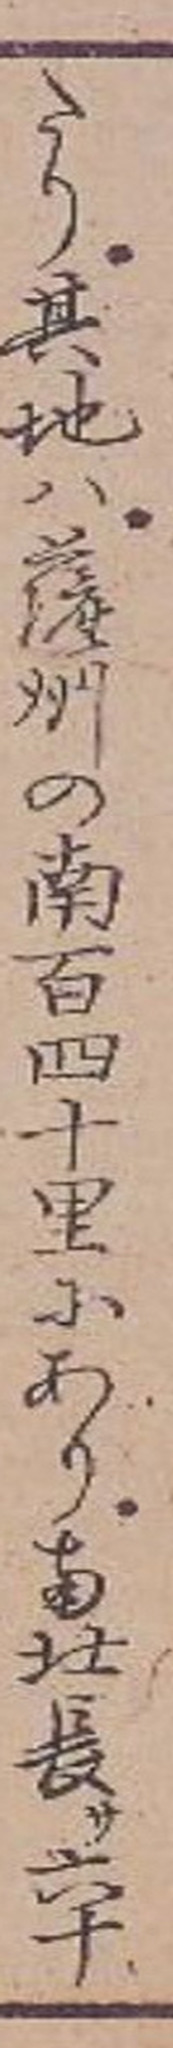たり•其地は•薩州の南百四十里にあり•南北長六十
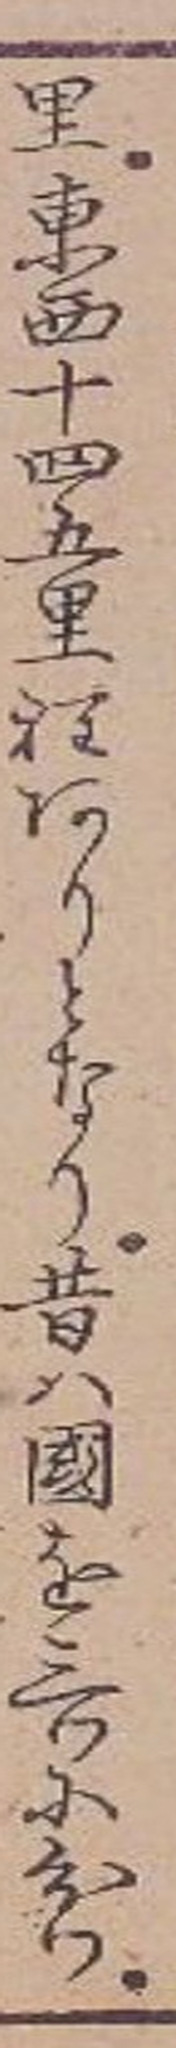里•東西十四五里程ありとなり•昔は国を三つに分つ•
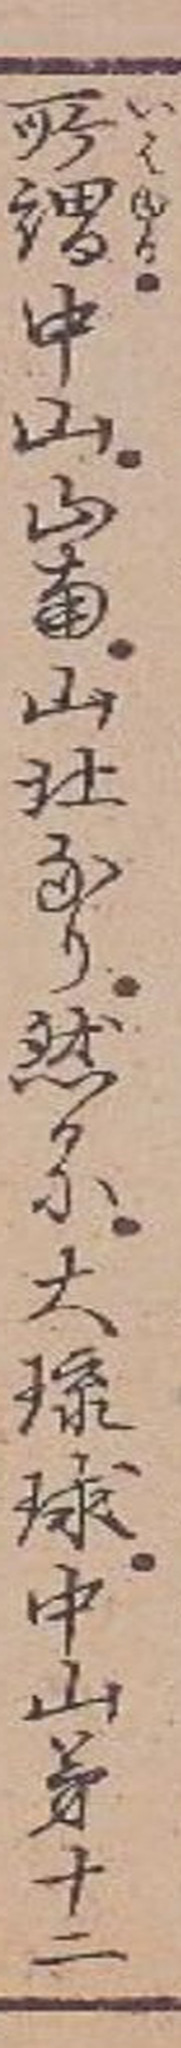所謂•中山•山南•山北なり•然るに•大琉球•中山
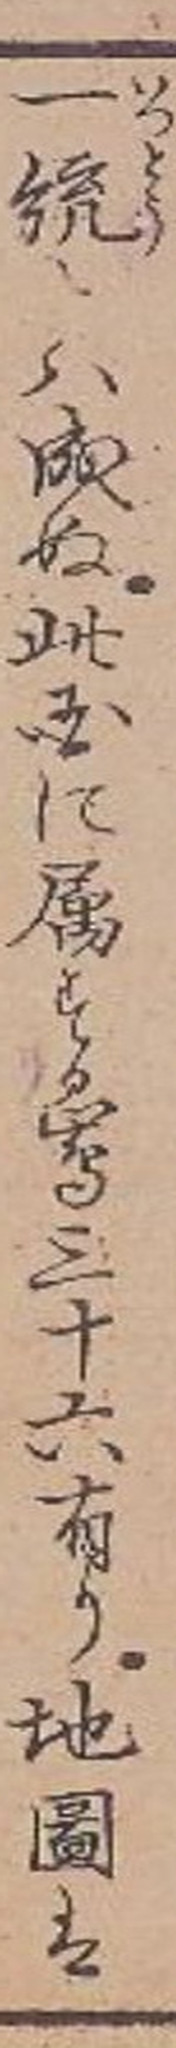一統には成ぬ•此国に属する島三十六有り•地図は
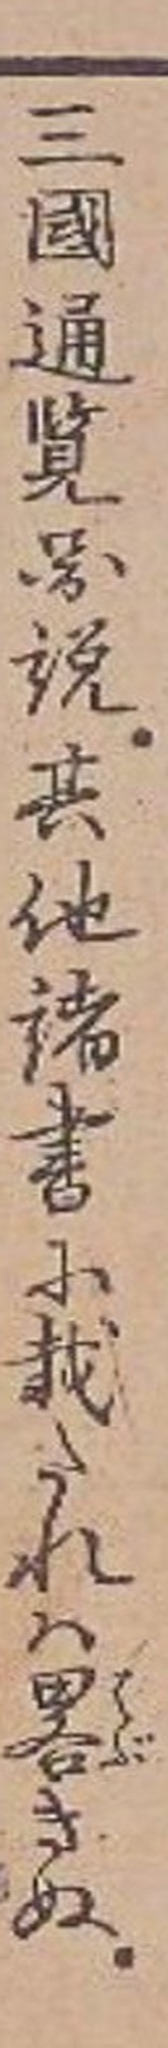三国通覧図説•其他諸書に載たれは略きぬ•
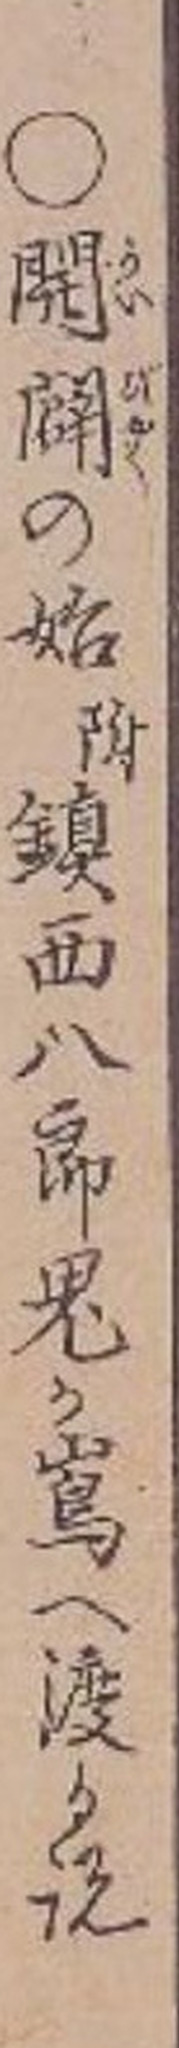〇開闢の始附鎮西八郎鬼か島へ渡る節
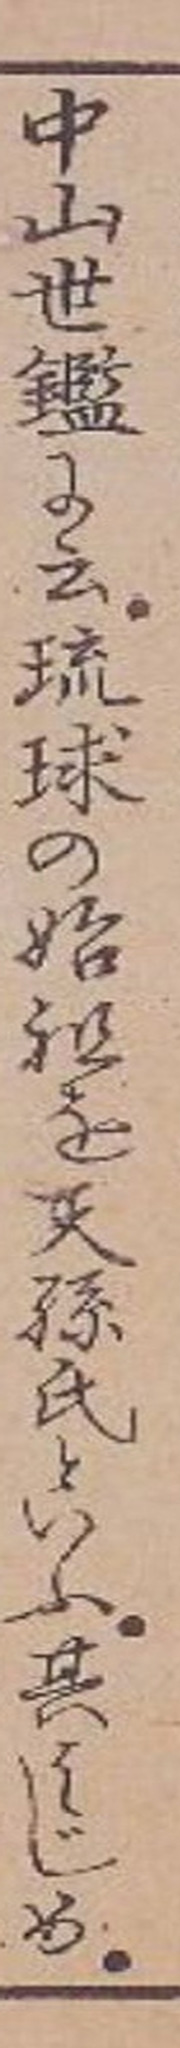中山世鑑に云•琉球の始祖を天孫氏といふ•其はしめ•
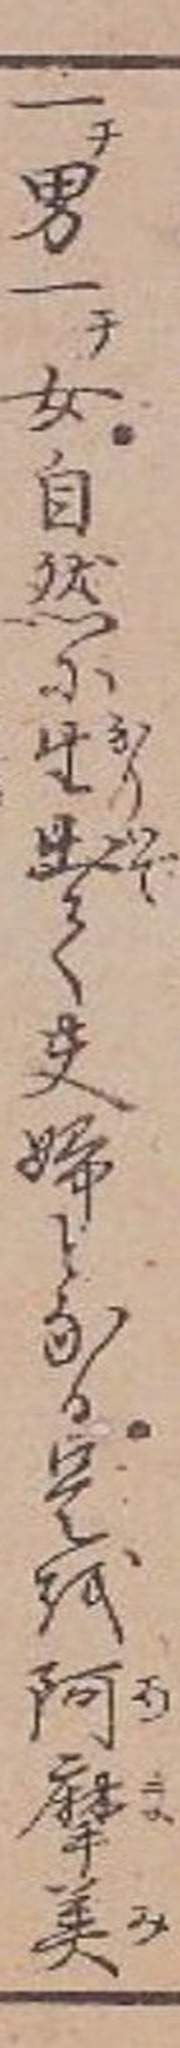一ち男一ち女•自然に生出て夫婦となる•是を阿摩美
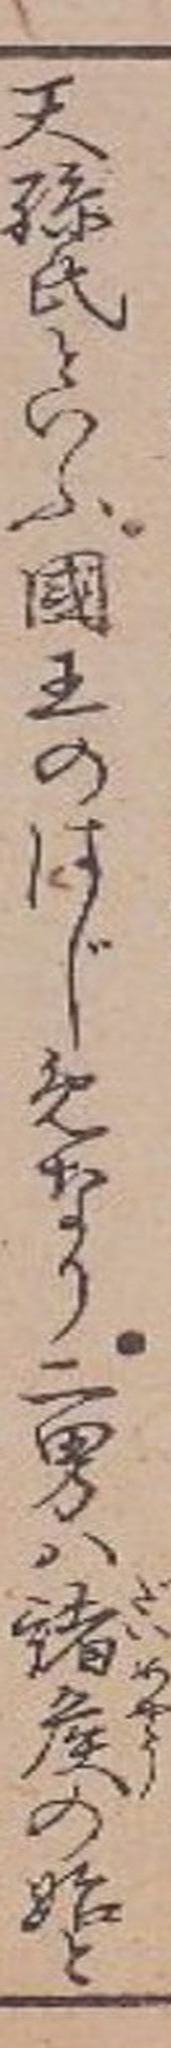天孫氏といふ•国王のはじめなり•二男は諸侯の始と
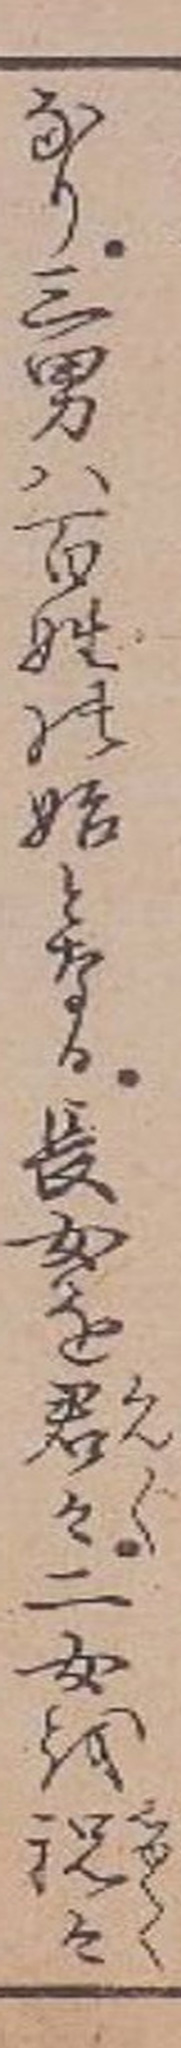なり•三男は百姓の始となる•長女を君々•二女を祝々
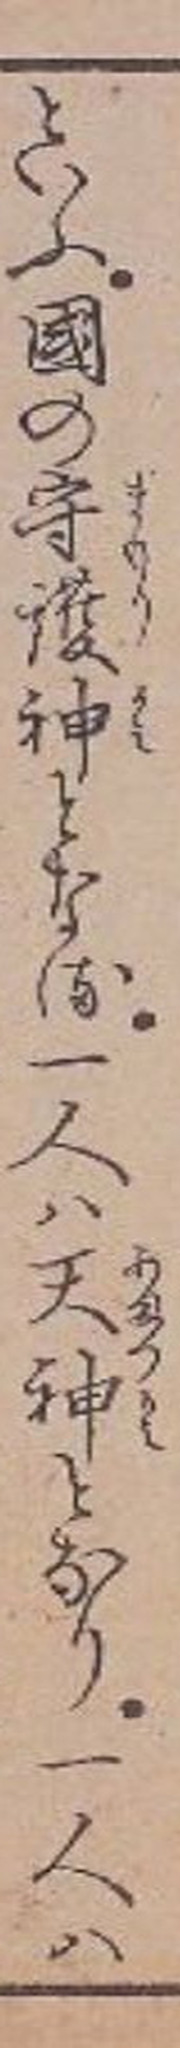といふ•国の守護神となる•一人は天神となり•一人は
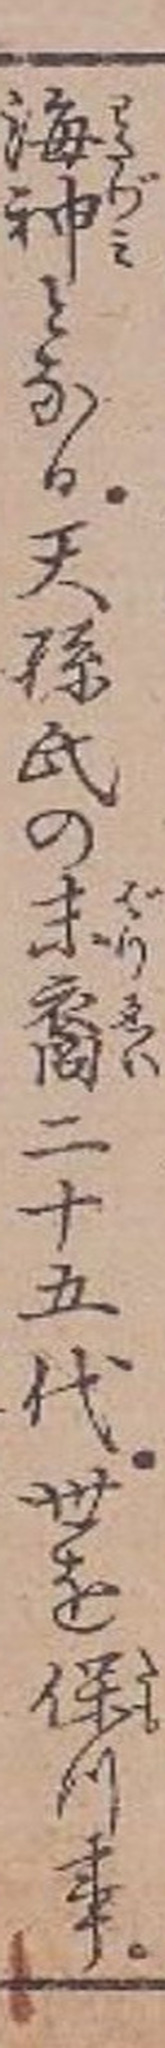海神となる•天孫氏の末裔二十五代•世を保つ事•
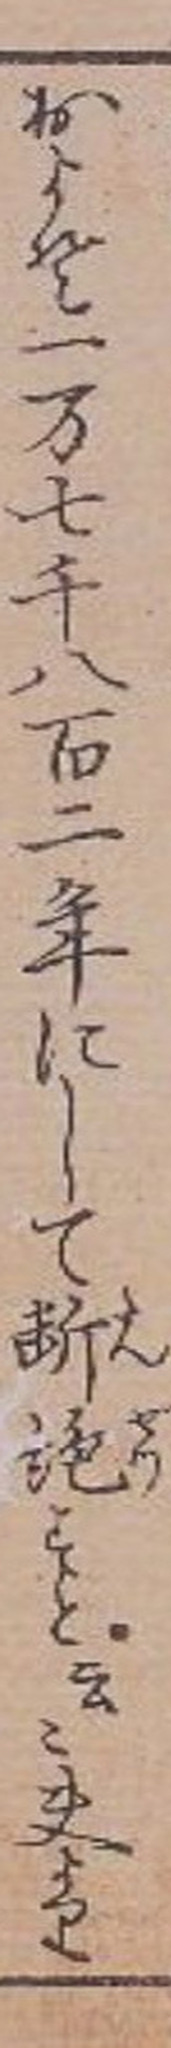およそ一万七千八百二年にして断絶すと•云々夫より

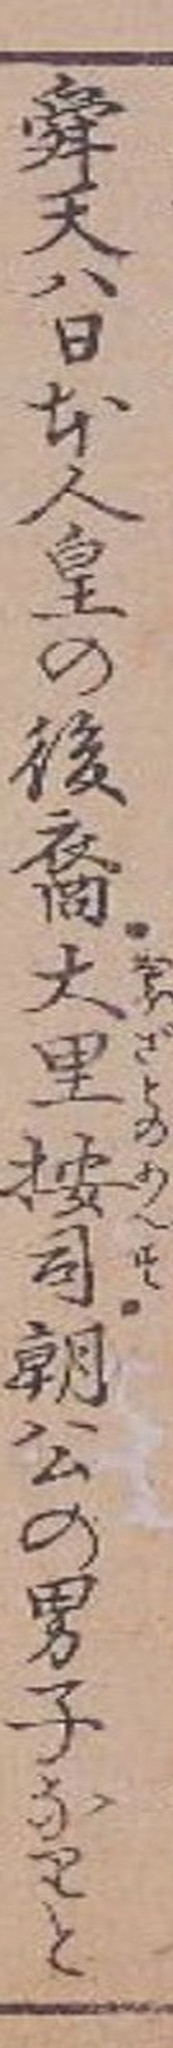舜天は日本人皇の後裔•大里按司•朝公の男子なりと
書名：琉球談
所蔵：University of the Ryukyus Library
